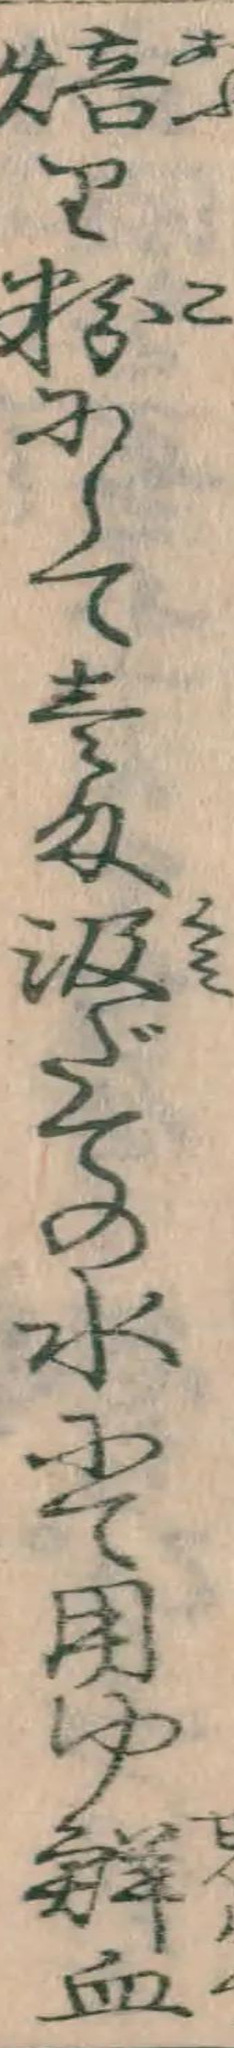焙り粉にして壱匁汲だての水にて用ゆ鮮血
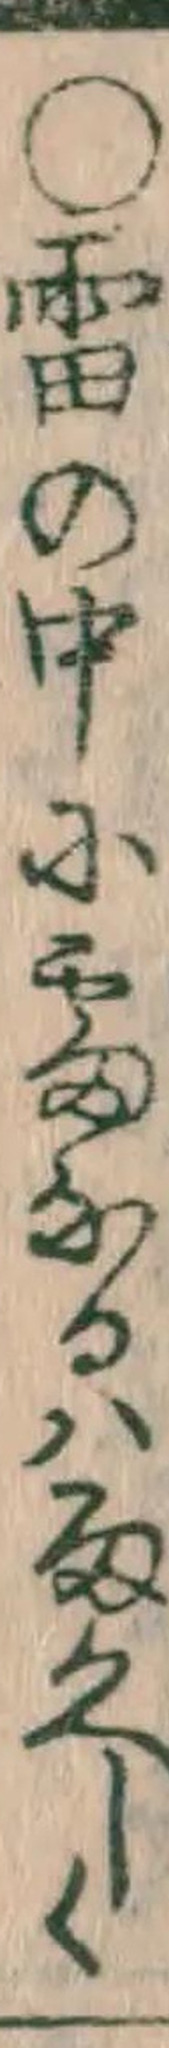○雷の中に雷なるは雨久しく
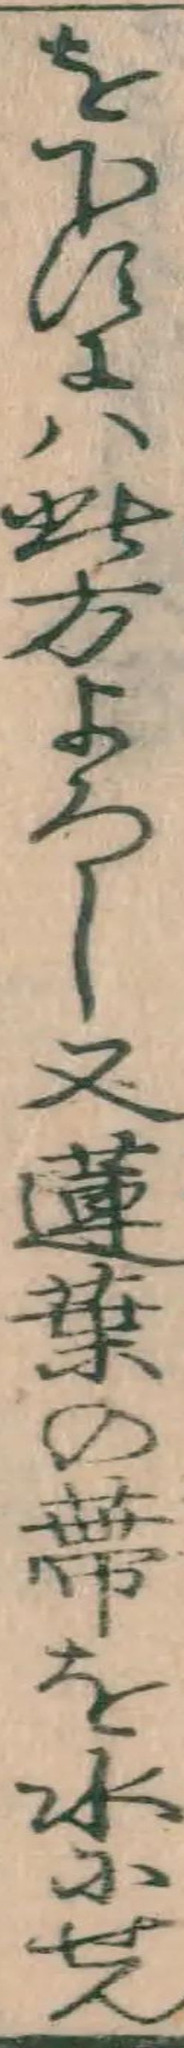を下すには此方よろし又蓮葉の蔕を水にせん
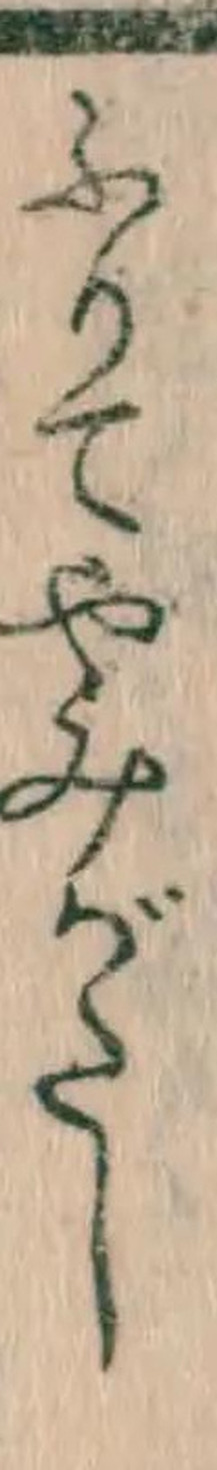ふりてやみがたし
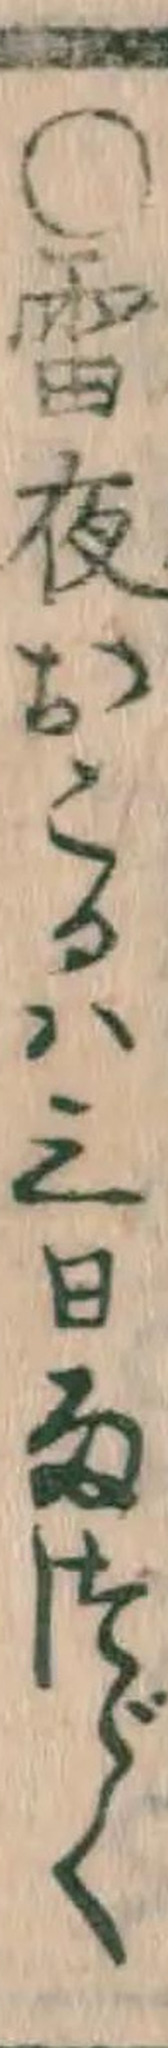○雷夜おこるは三日雨つゞく
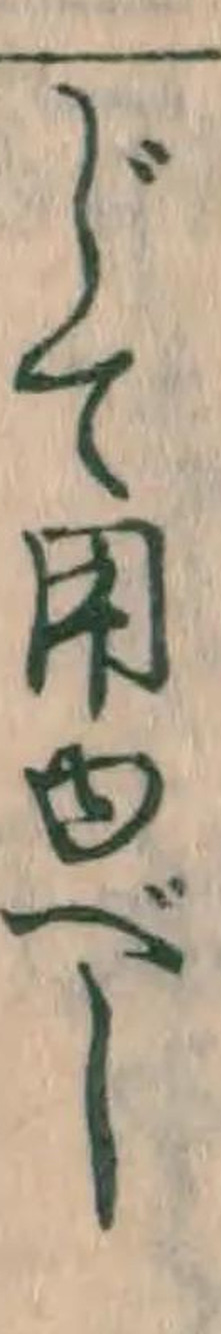じて用ゆべし
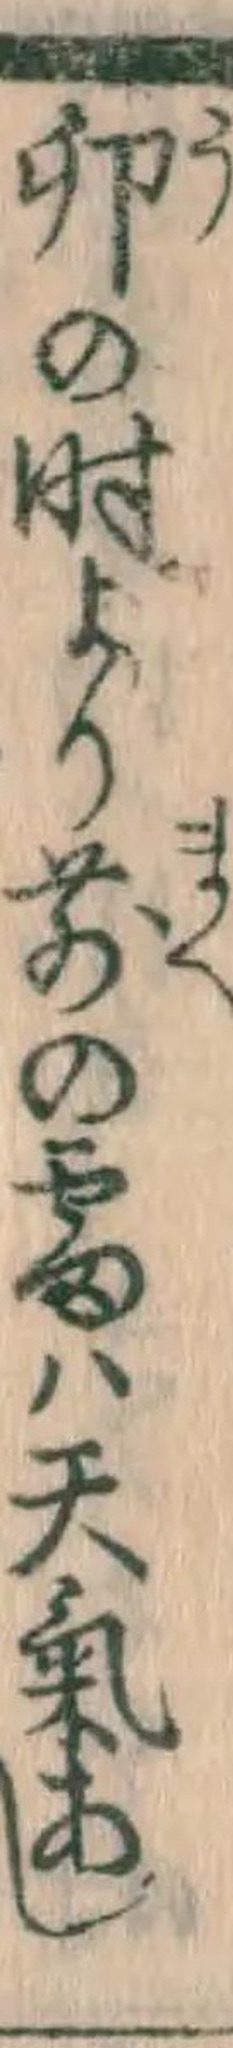卯の時より前の雷は天気あし
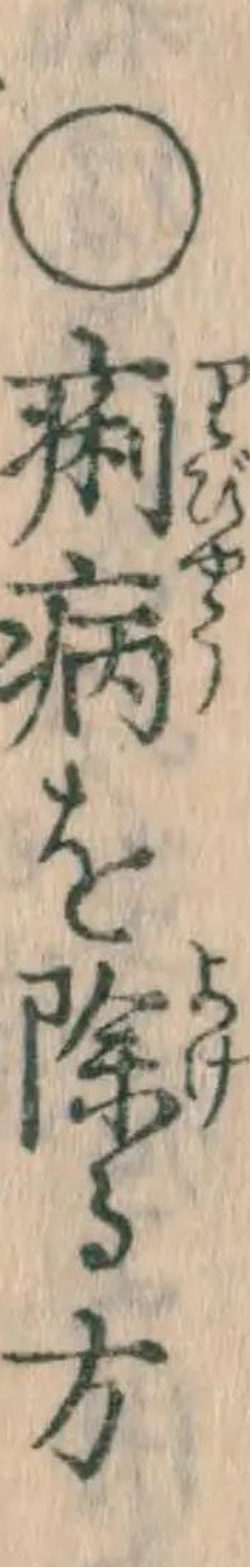○痢病を除る方
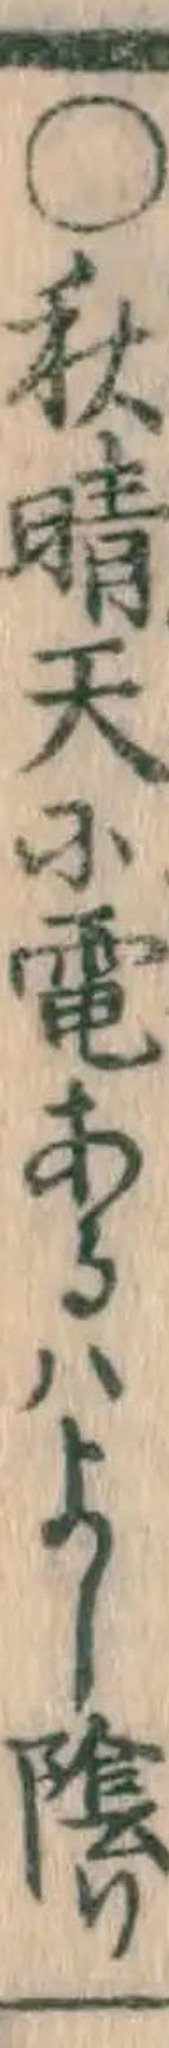○秋晴天に電あるはよし陰り
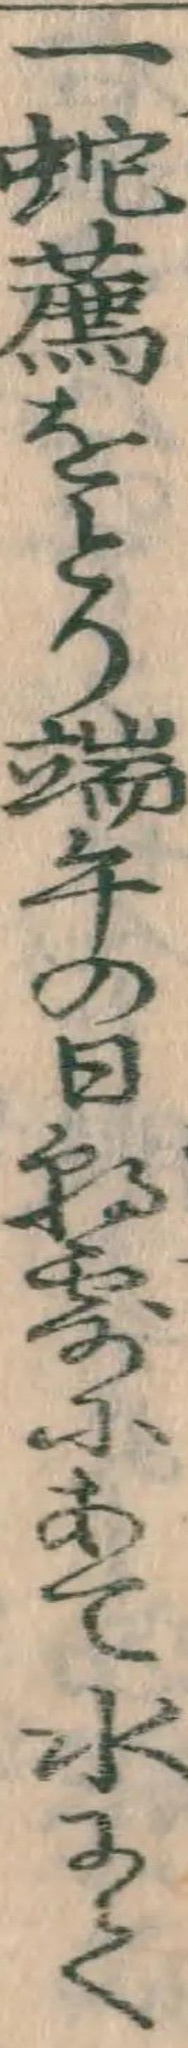一蛇薦をとり端午の日朝露にあて水にて
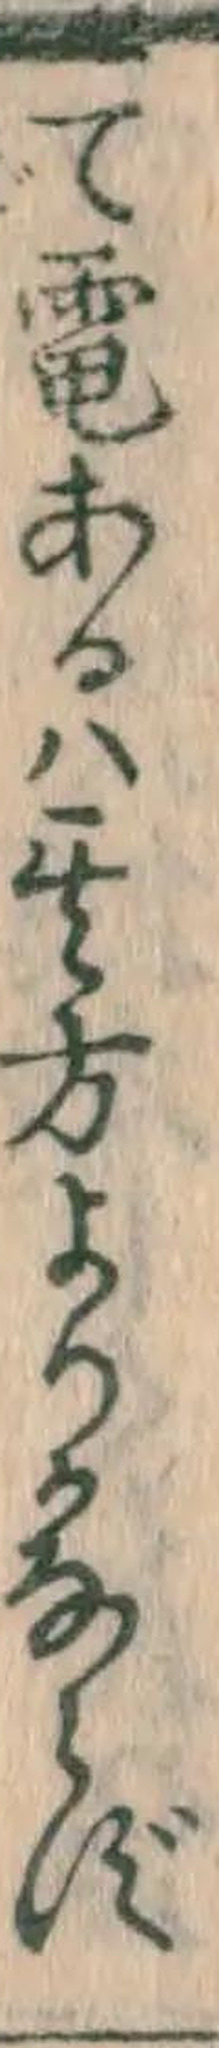て電あるは其方よりかならず
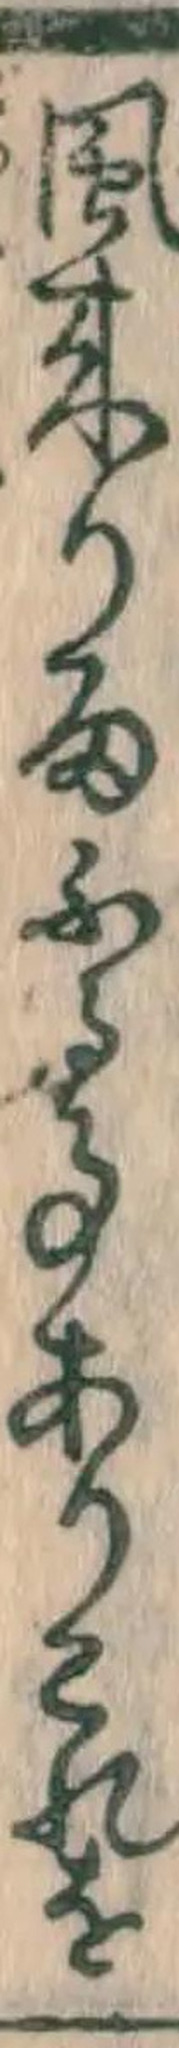風来り雨ふる事ありこれを
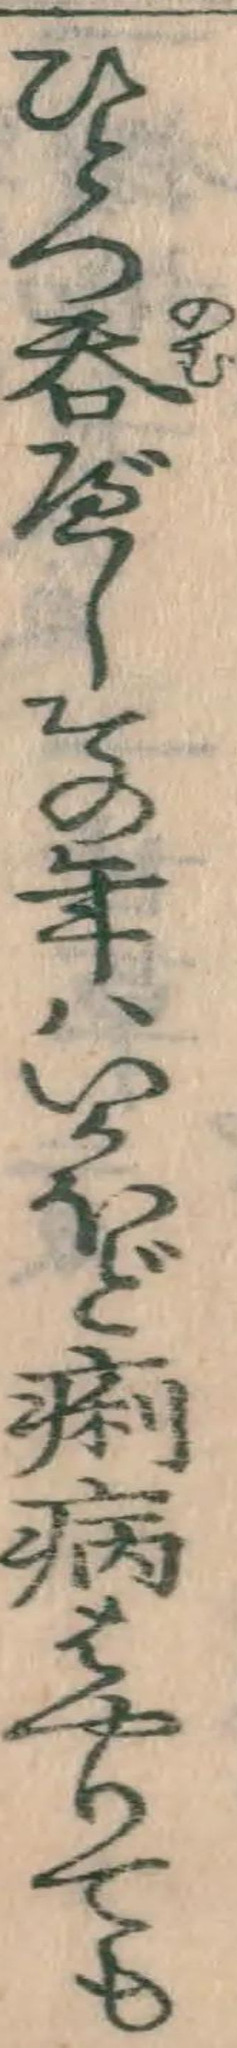ひとつ呑べしその年はいかほど痢病はやりても
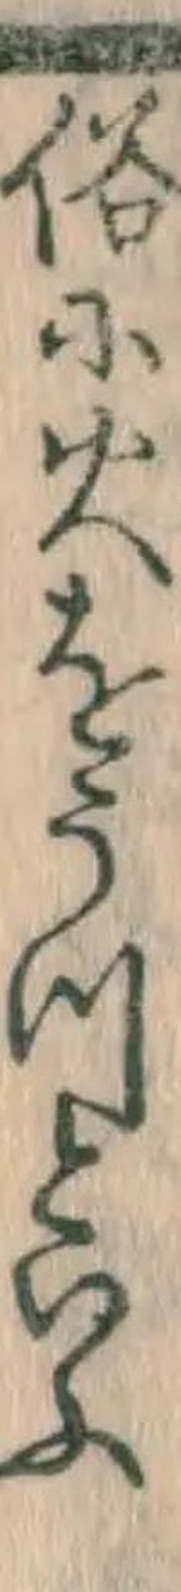俗に火をうつといふ
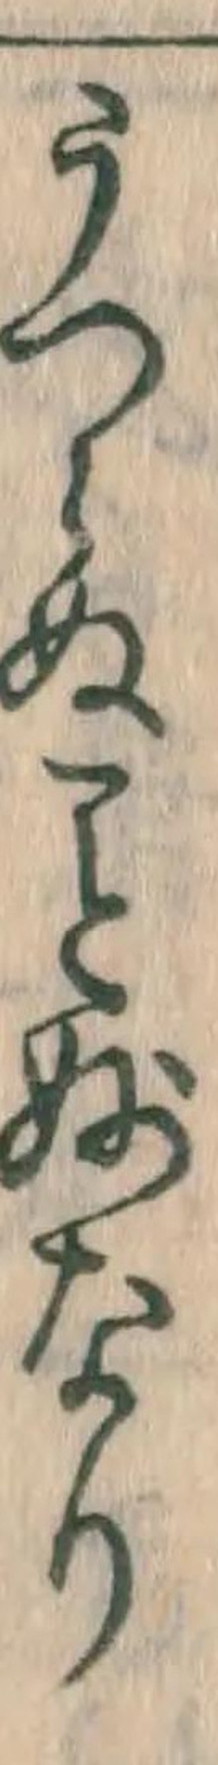うつらぬこと妙なり
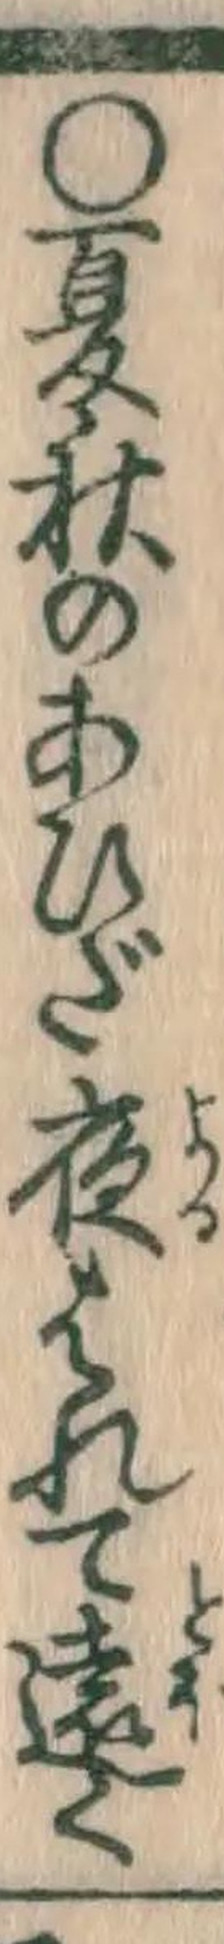○夏秋のあひだ夜はれて遠く
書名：広益秘事大全 3巻. [4]
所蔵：国立国会図書館 National Diet Library, JAPAN
